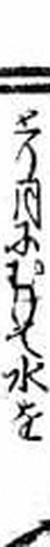とり月にむけて水を
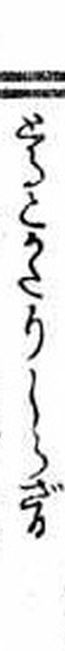とるとかたりしらざる
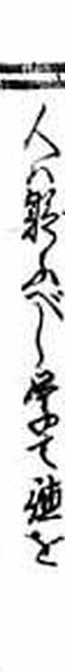人は疑ふべし学て徳を
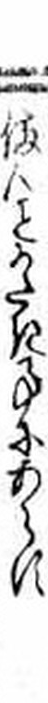備んことかたき事にあらす
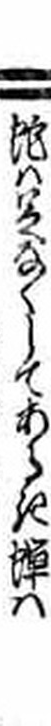蛇は足なくしてあるき蝉は
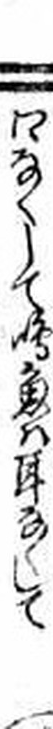口なくして鳴魚は耳なくして
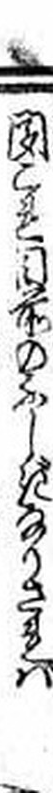聞これ目前のふしぎなりされば
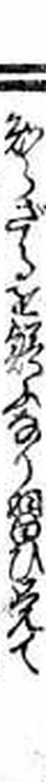知らざるを疑ふなり習ひ覚て
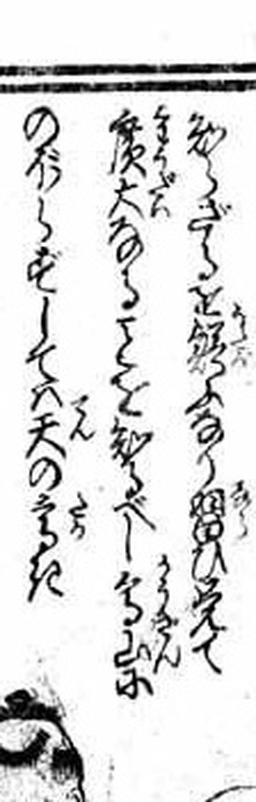広大なることを知るべし高山に
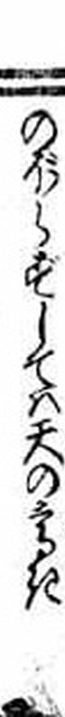のぼらずしては天の高き
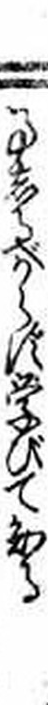事しるべからず学びて知る
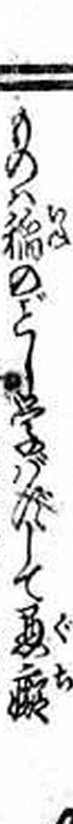ものは稲のごとし学ばずして愚痴
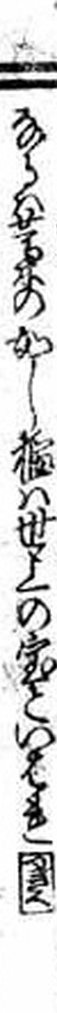なるは藁の如し稲は世上の宝といはれつきへ

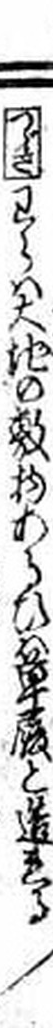つゞきわらは大地の敷物あるひは草履と造れる
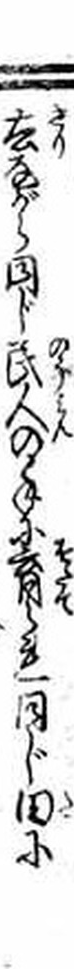去ながら同じ民人の手に育られ同じ田に
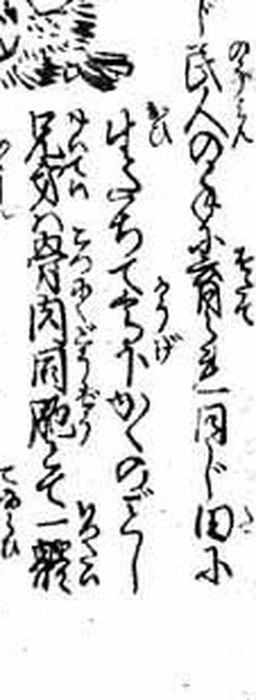生たちて高下かくのごとし
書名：百姓往来画抄
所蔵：東京学芸大学教育コンテンツアーカイブ
